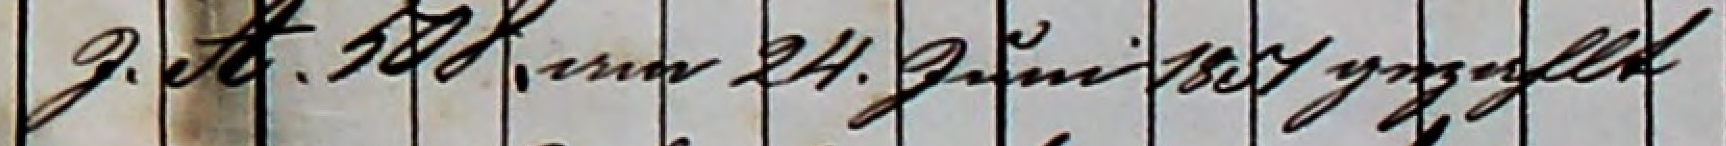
J. A. 508. am 24. Juni 1851 gezahlt
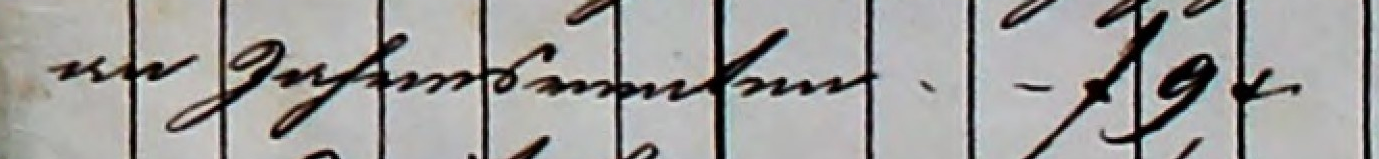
an Jahresrenten - f 9 &
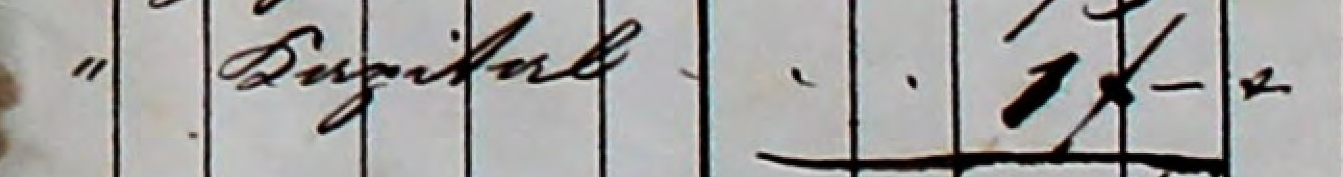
„ Kapital 1 f - &
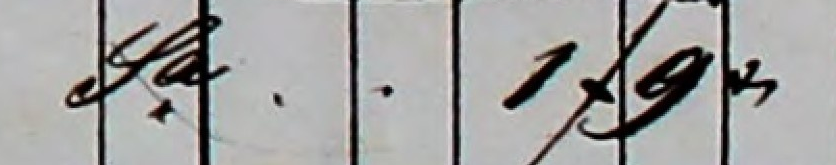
Sa 1 f 9 &
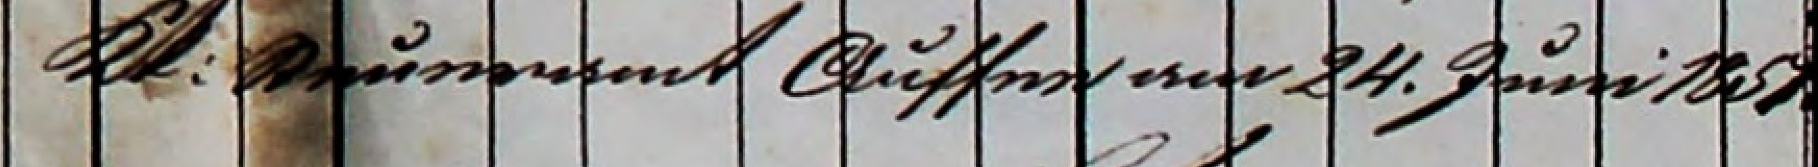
Kl: Steueramt Aussee am 24. Juni 1851.
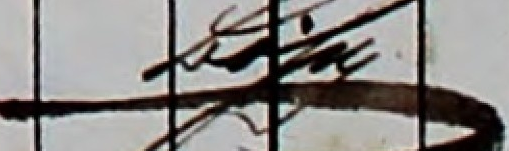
Bohn
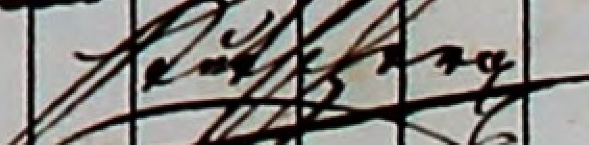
Kutscheng
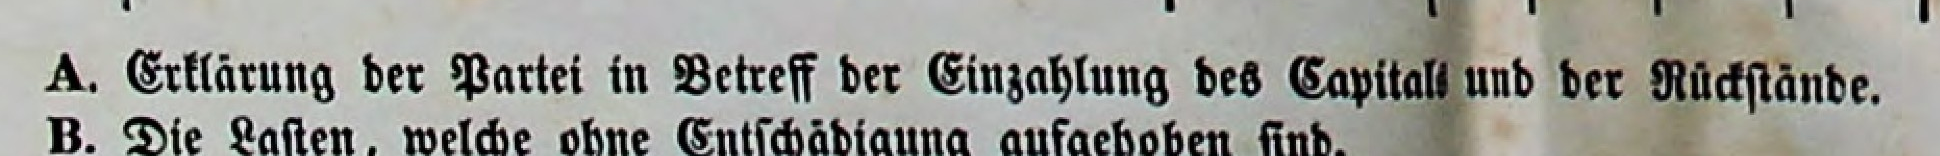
A. Erklärung der Partei in Betreff der Einzahlung des Capitals und der Rückstände.
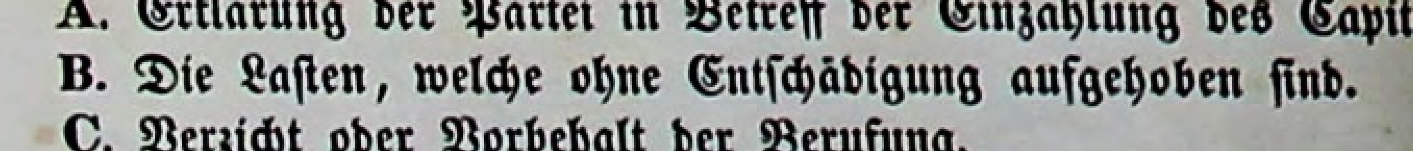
B. Die Lasten, welche ohne Entschädigung aufgehoben sind.
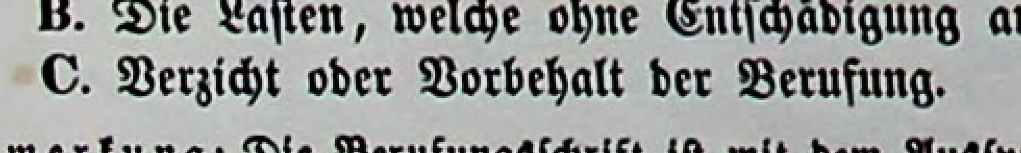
C. Verzicht oder Vorbehalt der Berufung.
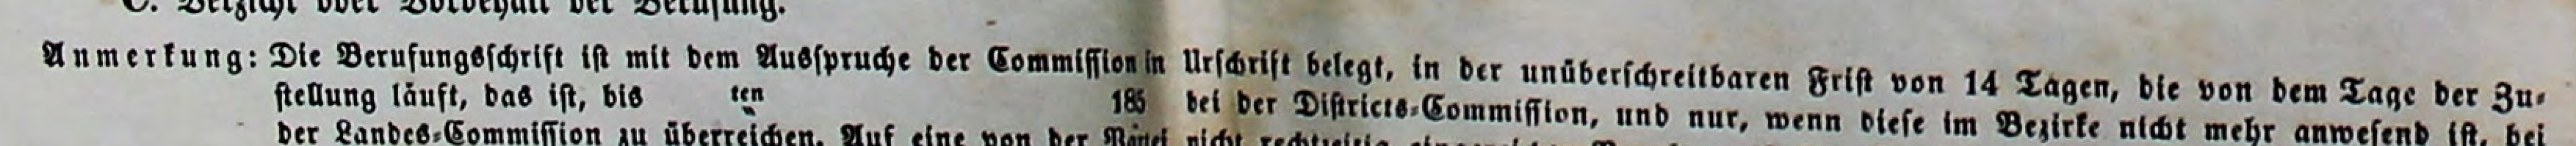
Anmerkung: Die Berufungsschrift ist mit dem Ausspruche der Commission in Urschrift belegt, in der unüberschreitbaren Frist von 14 Tagen, die von dem Tage der Zu=
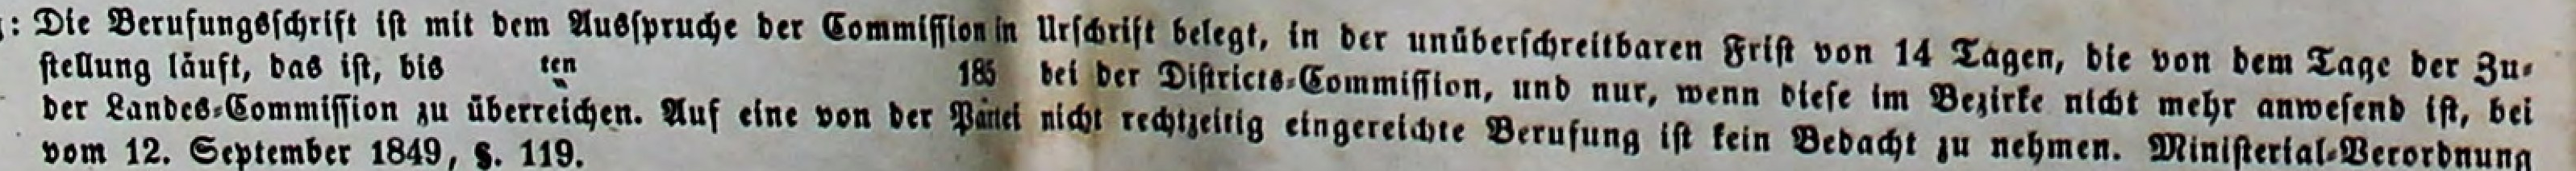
stellung läuft, das ist, bis ten 185 bei der Districts=Commission, und nur, wenn diese im Bezirke nicht mehr anwesend ist, bei
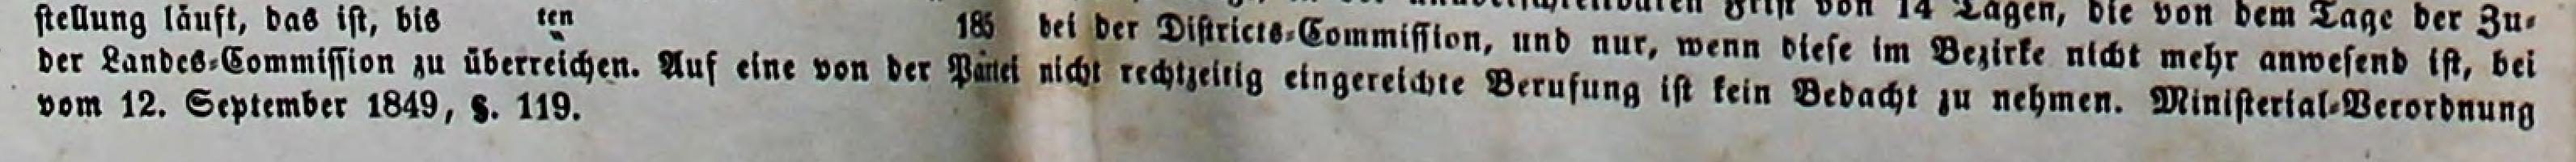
der Landes=Commission zu überrechen. Auf eine von der Partei nicht rechtzeitig eingereichte Berufung ist kein Bedacht zu nehmen. Ministerial=Verordnung
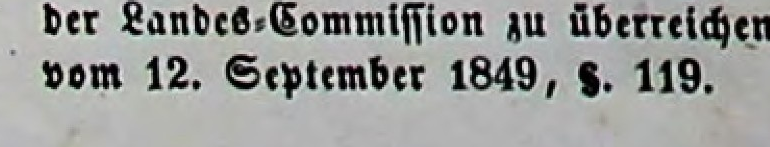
vom 12. September 1849, §. 119.
